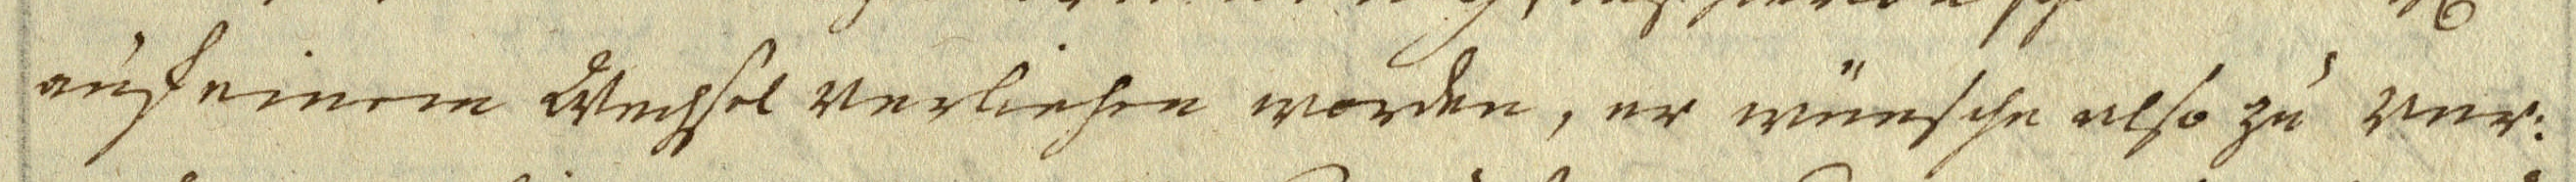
auf einem Wechsel verleihen worden, er wünsche also zu ver¬
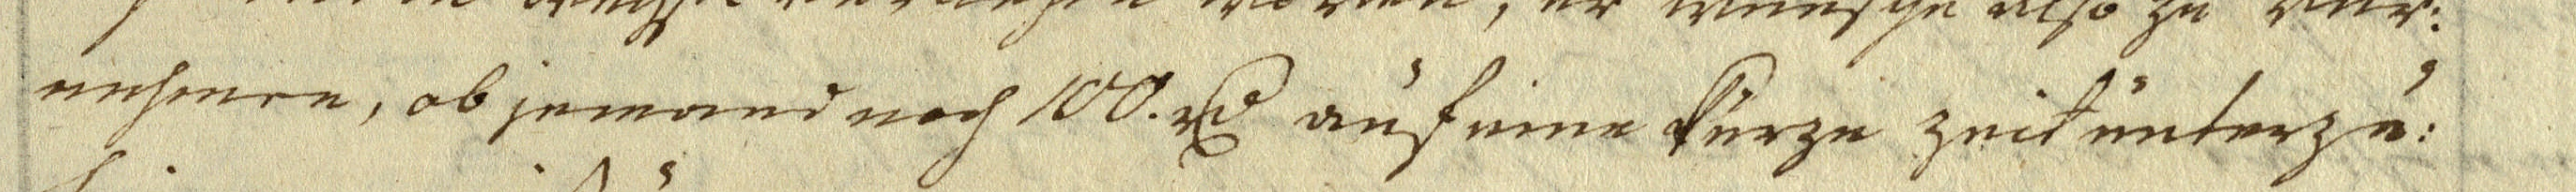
nehmen, ob jemand noch 100. rt auf eine kurze zeit unterzu¬
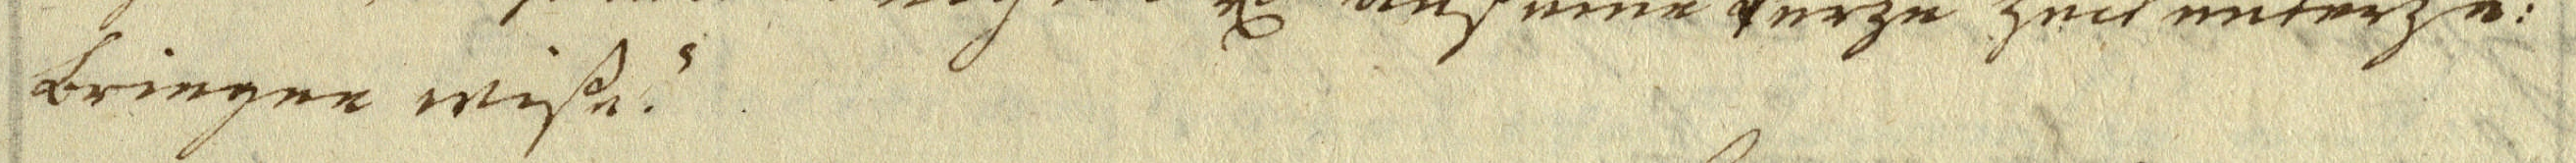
bringen wiße?
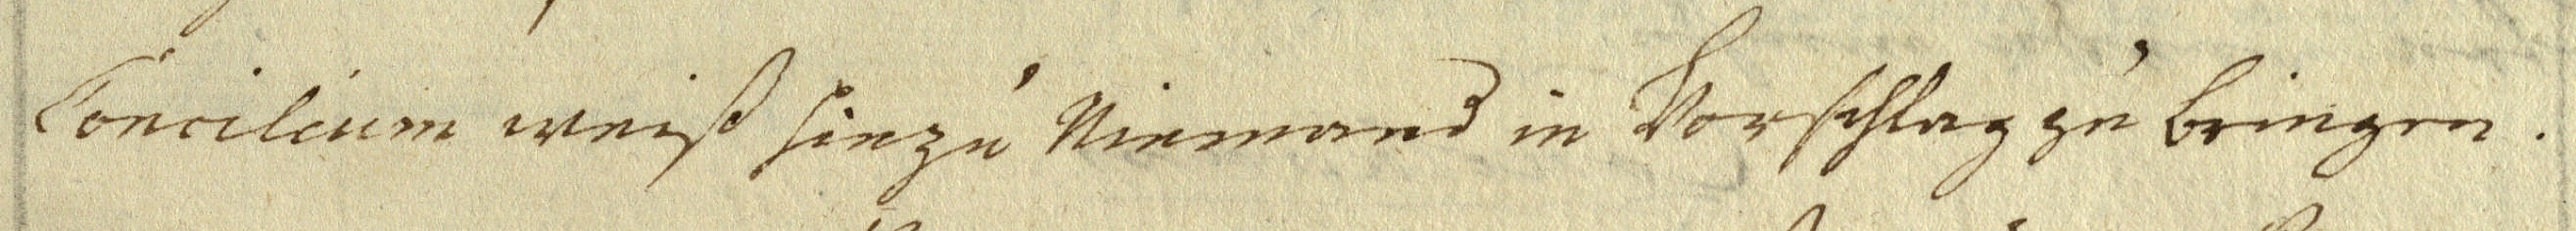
Concilium weiß hiezu Niemand in Vorschlag zu bringen.
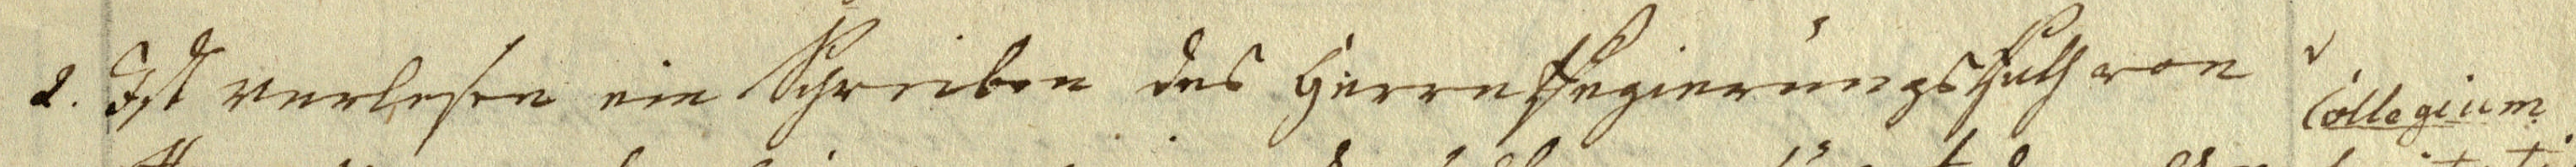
2. Ist verlesen ein Schreiben des Herrn RegierungsRath von Collegium
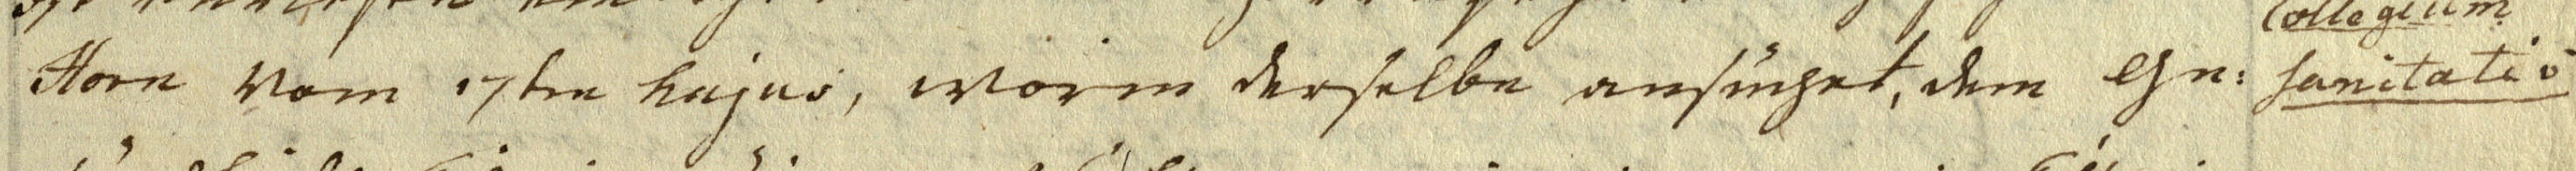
Horn vom 17ten hujus, worin derselbe ansuchet, dem Ge¬ sanitatio
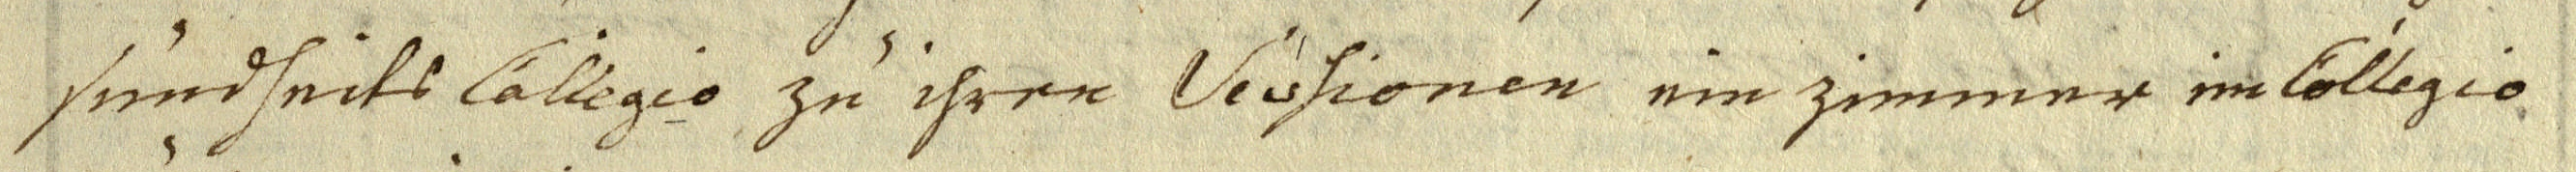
sundheits Collegio zu ihren Sessionen ein zimmer im Collegio
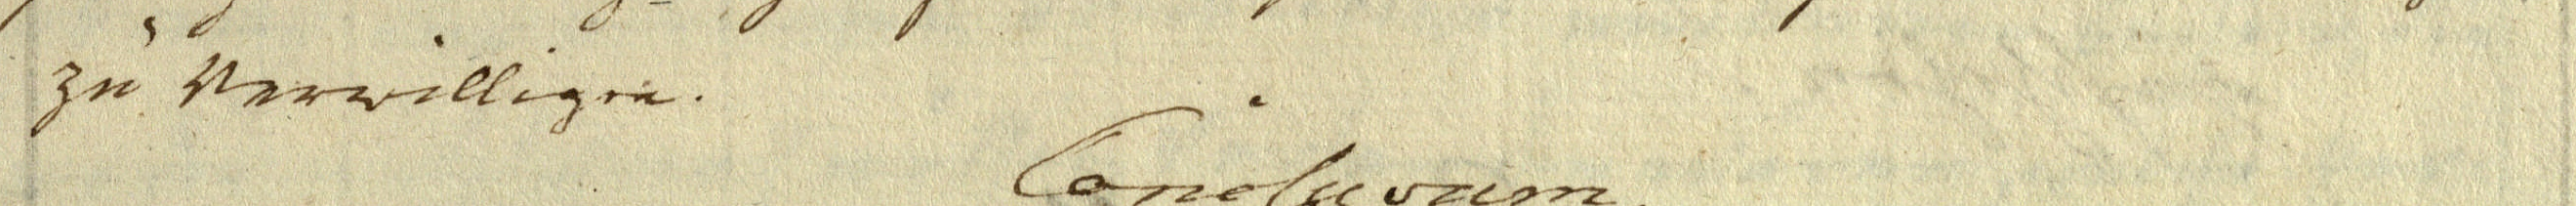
zu verwilligen.
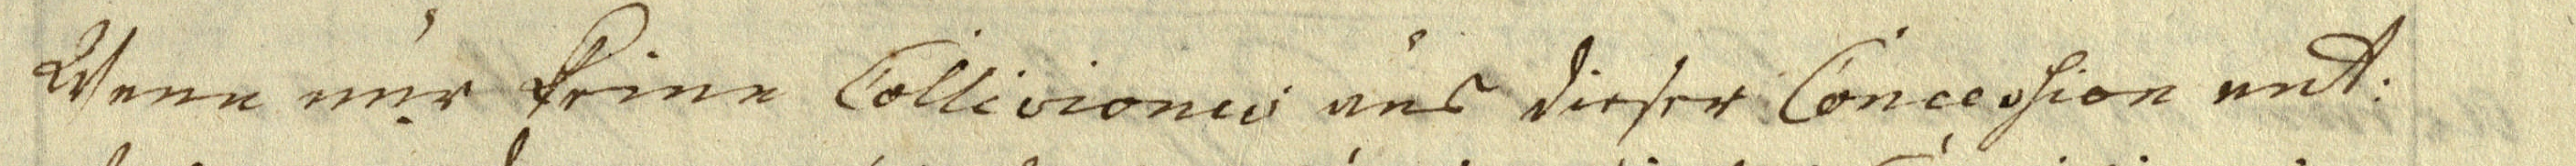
Wenn nur keine Collisiones aus dieser Concession ent¬
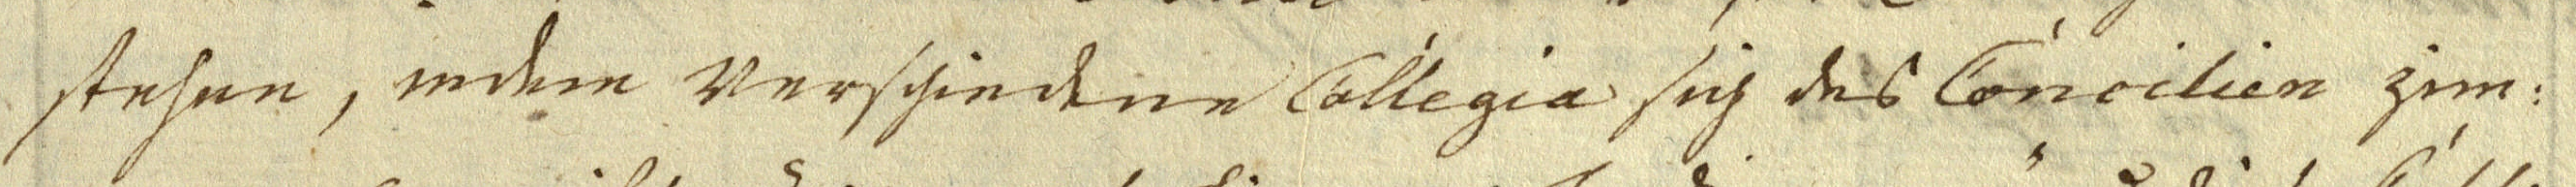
stehen, indem verschiedene Collegia sich des Concilien zim¬
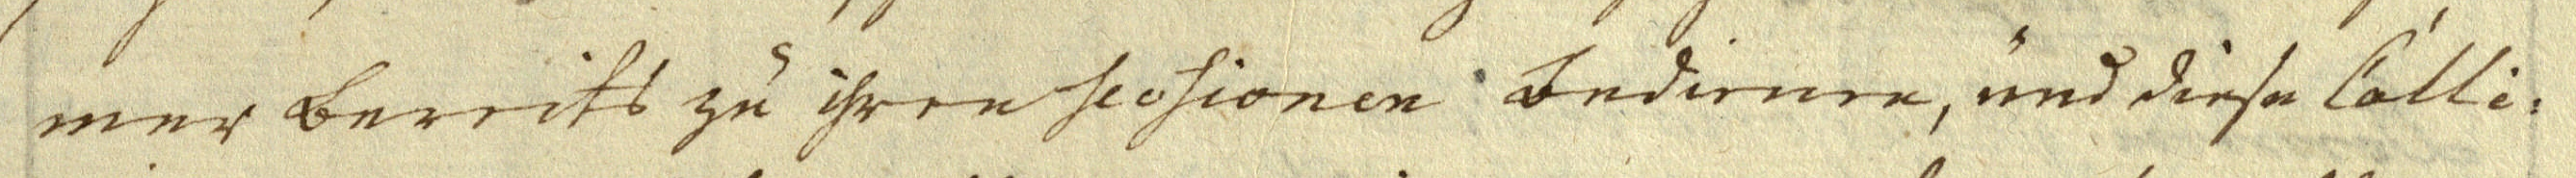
mer bereits zu ihren sessionen bedienen, und diese Collis¬
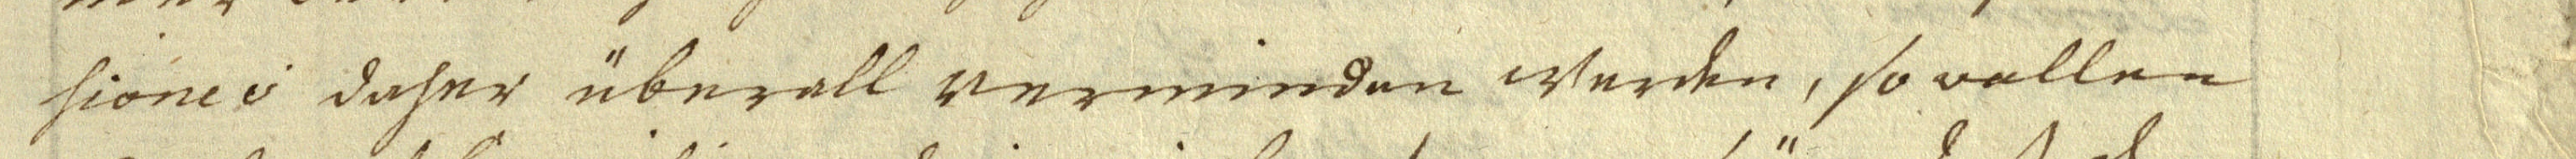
siones daher überall vermieden werden, so wollen
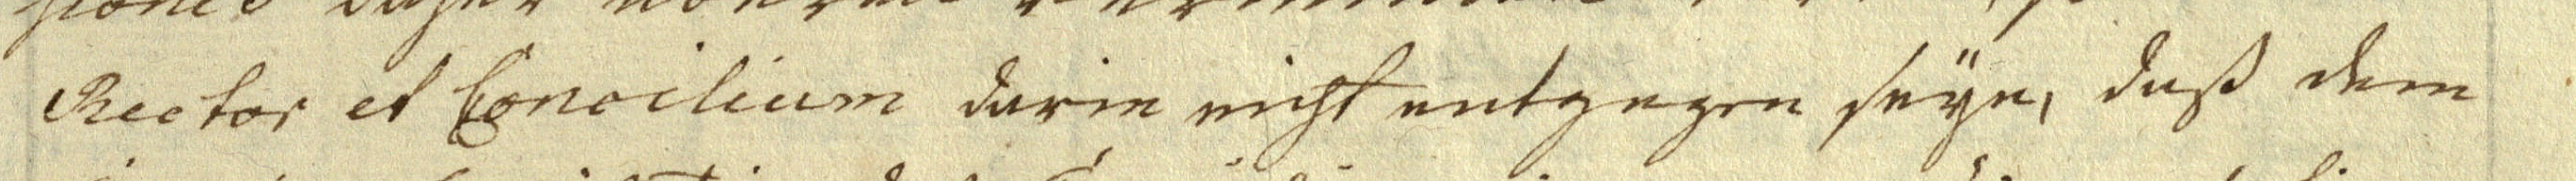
Rector et Concilium darin nicht entgegen seÿn, daß dem
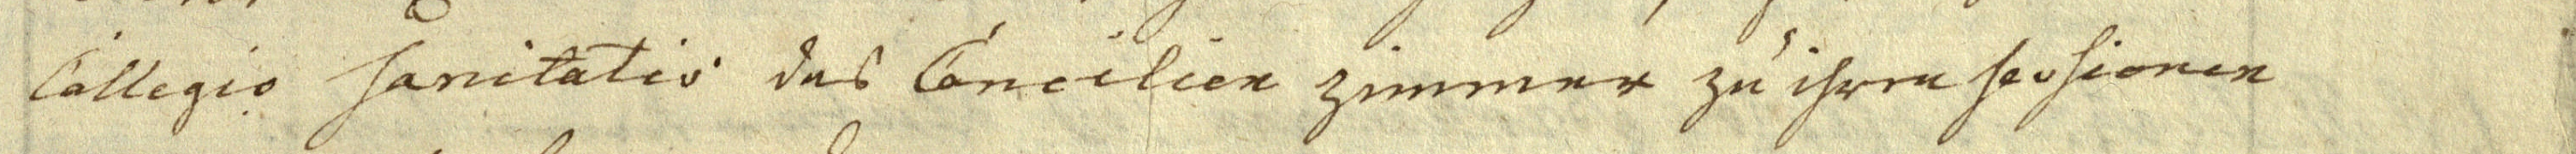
Collegio sanitatis das Concilien zimmer zu ihren sessionen
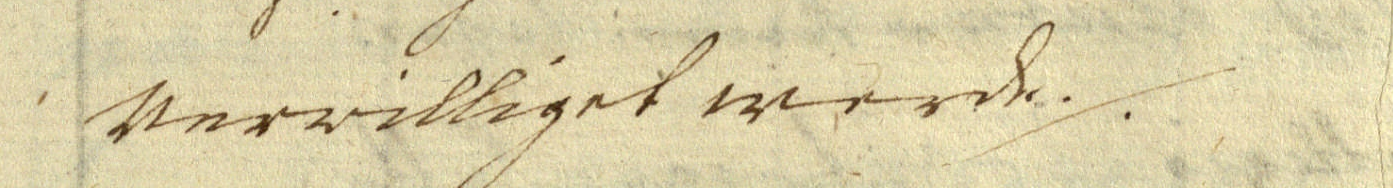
verwilliget werde.
